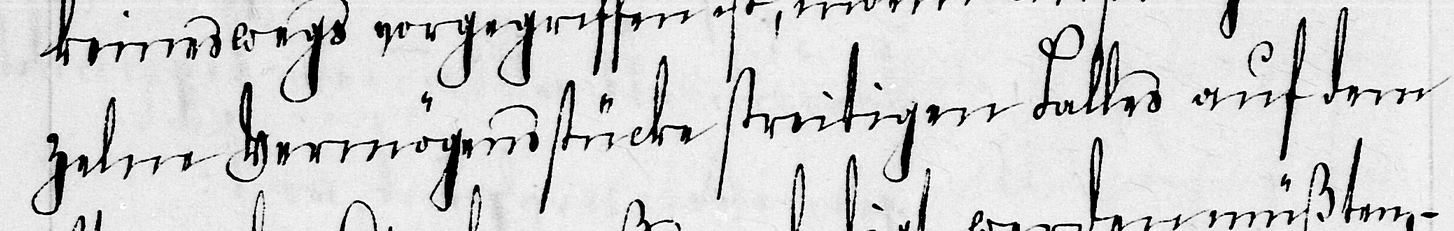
zelne Vermögensstücke streitigen Falles auf dem
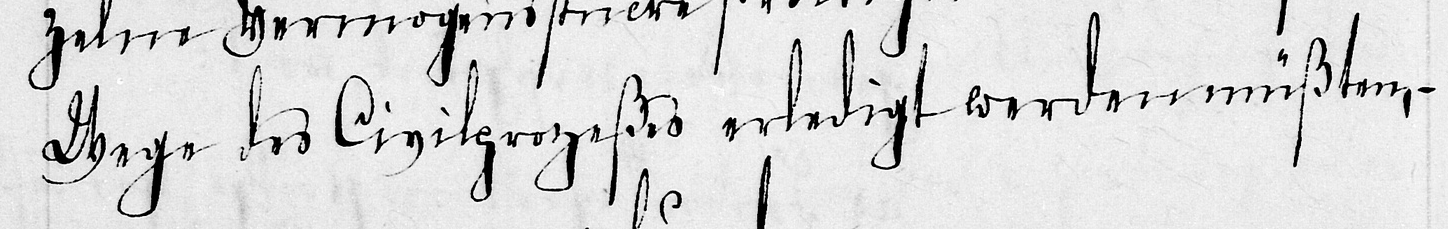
Wege des Civilprozeßes erledigt werden müßten, –
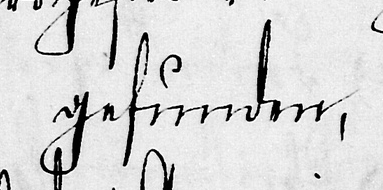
gefunden,
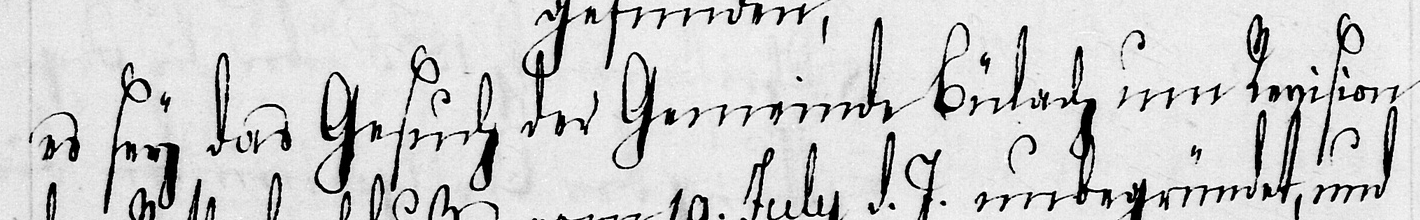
es sey das Gesuch des Gemeinde Bülach um Revision
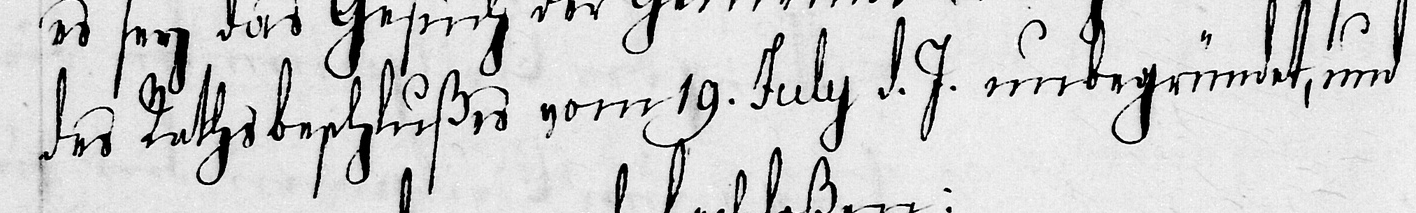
des Rathsbeschlußes vom 19. July d. J. unbegründet, und
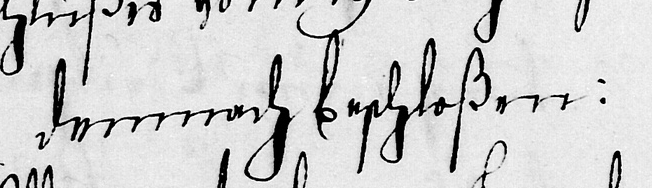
demnach beschloßen:
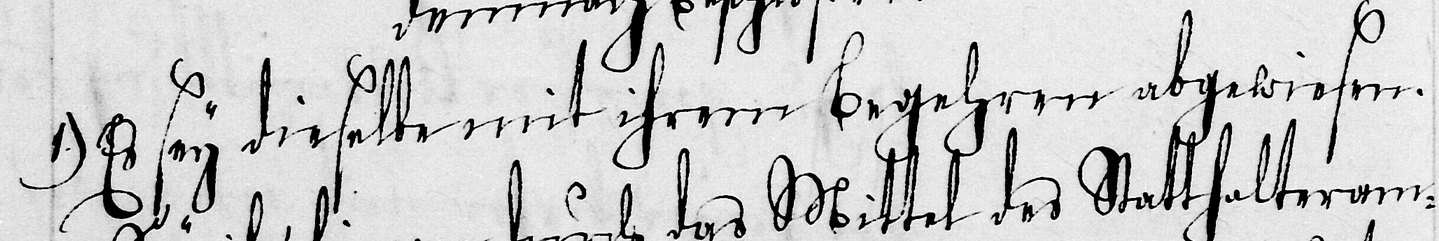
1.) Es sey dieselbe mit ihrem Begehren abgewiesen.
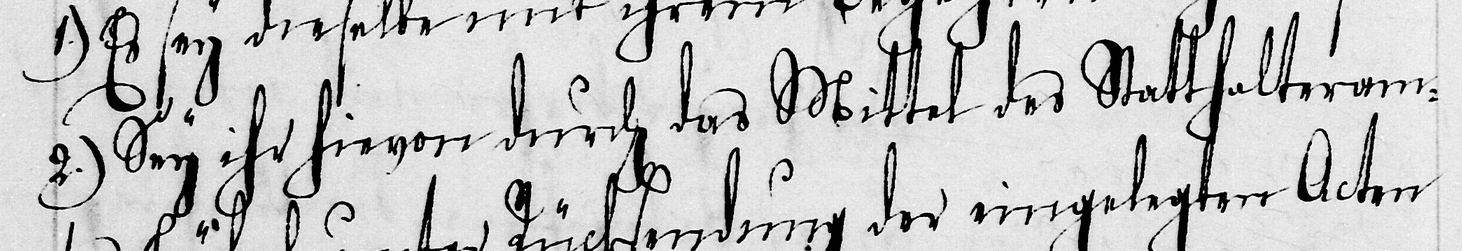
2.) Sey ihr hievon durch das Mittel des Statthalteram¬
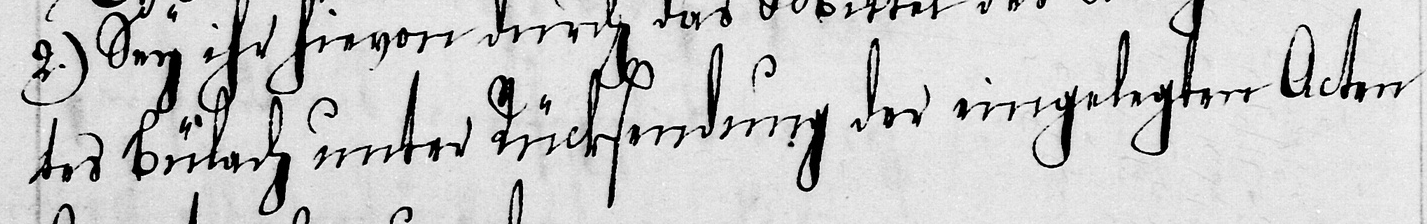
tes Bülach unter Rücksendung der eingelegten Acten
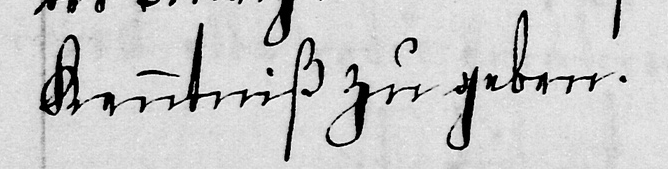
Kenntniß zu geben.
